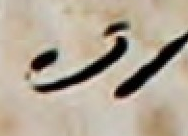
51
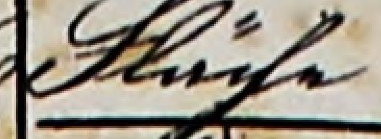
Fläche
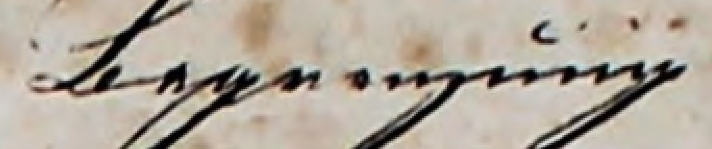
Begrenzung
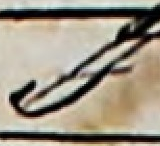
J.
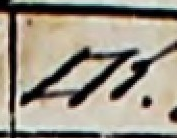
CK.
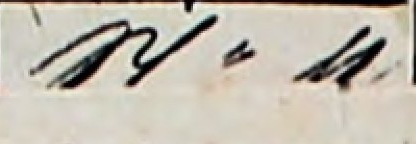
???
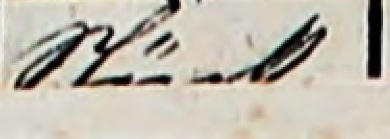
???
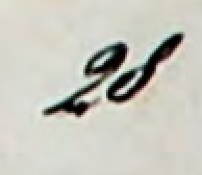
28
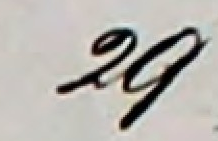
29
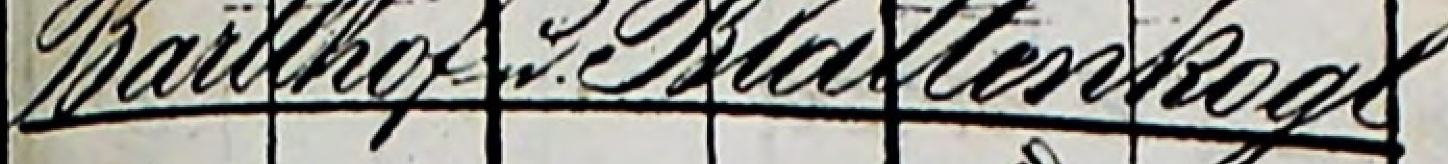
Bartthof u. Blattenkogl
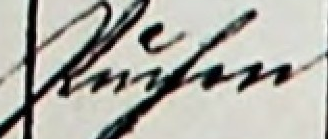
Puchen
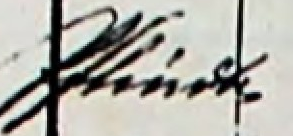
Pflinds
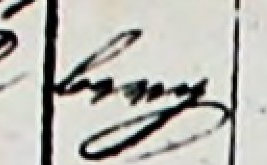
berg
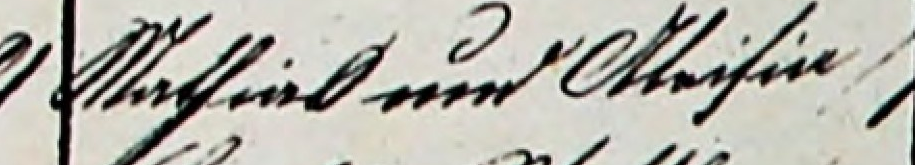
Mathias und Aloisia
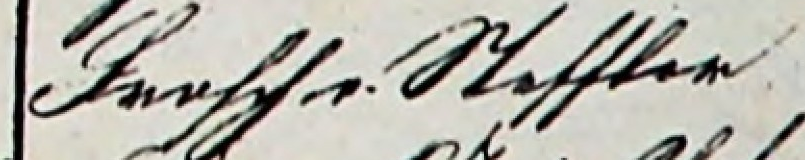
Frosch v. Steffler
